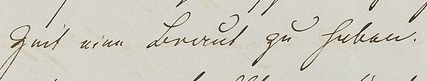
Zeit eine Braut zu haben.
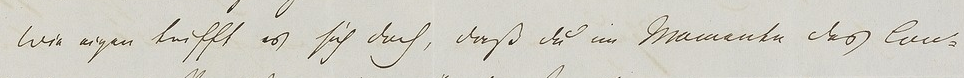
Wie eigen trifft es sich doch, daß du im Momente des Con-
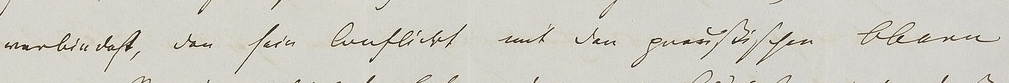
verbindest, den sein Conflikt mit den preußischen Obern
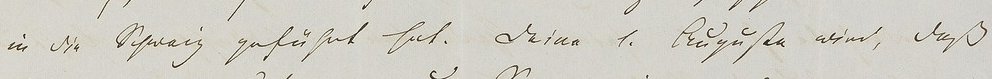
in die Schweiz geführt hat. Deine l. Auguste wird, deß
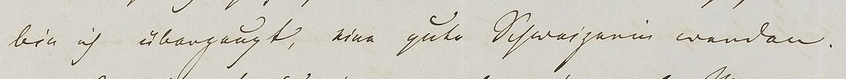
bin ich überzeugt, eine gute Schweizerin werden.
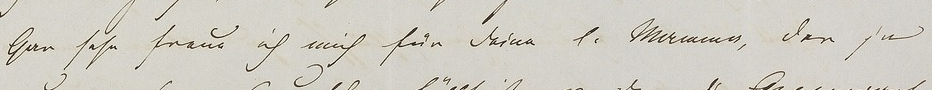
Gar sehr freue ich mich für l. deine Mamma, der ja
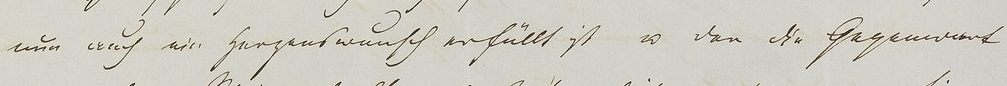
nun auch ein Herzenswunsch erfüllt ist & der die Gegenwart
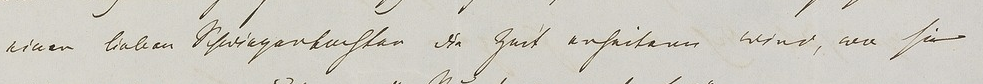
einer lieben Schwiegertochter die Zeit erheitern wird, wo sie
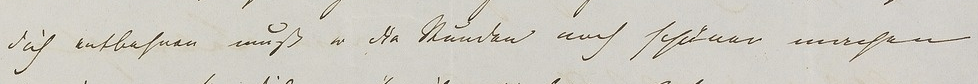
dich entbehren muß & die Stunden noch schöner machen
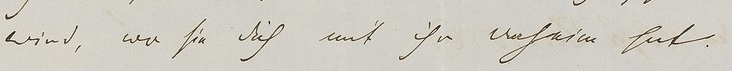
wird, wo sie dich mit ihr daheim hat.
